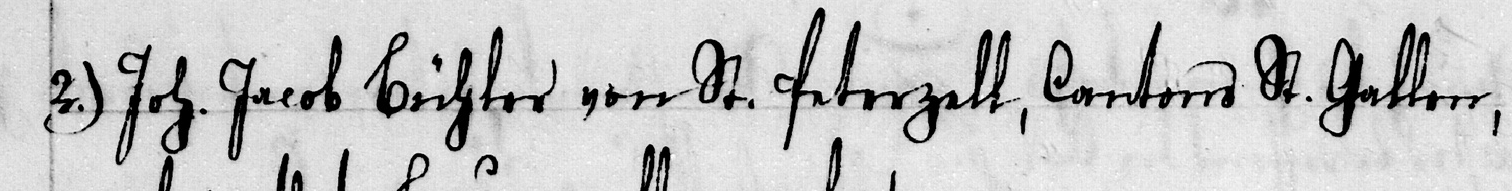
2.) Joh. Jacob Bühler von St. Peterzell, Cantons St. Gallen,
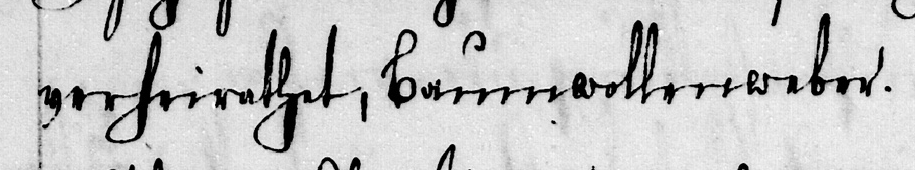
verheirathet, Baumwollenweber.
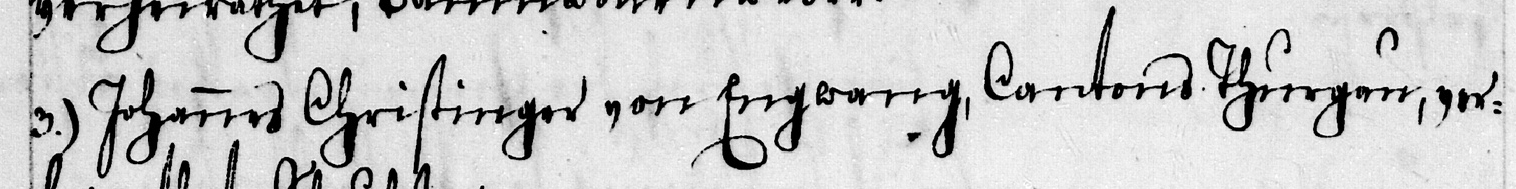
3.) Johannes Christinger von Engwang, Cantons Thurgau, ver¬
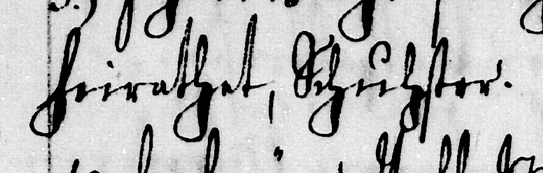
heirathet, Schuhster.
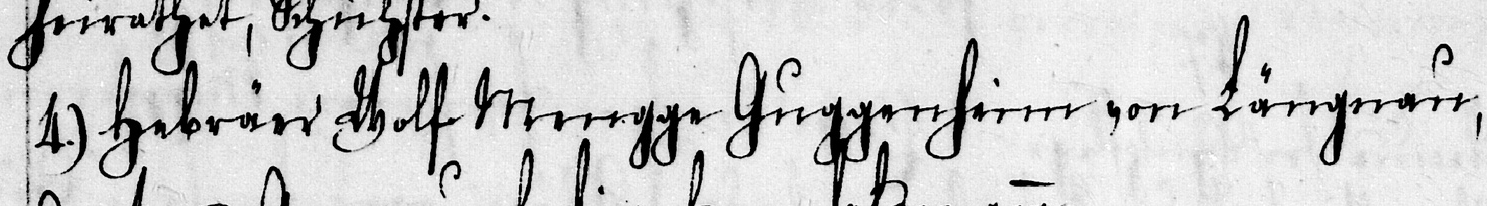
4.) Hebräer Wolf Mengge Guggenheim von Längnau,
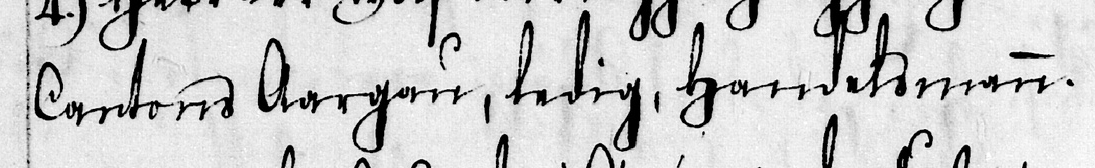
Cantons Aargau, ledig, Handelsmann.
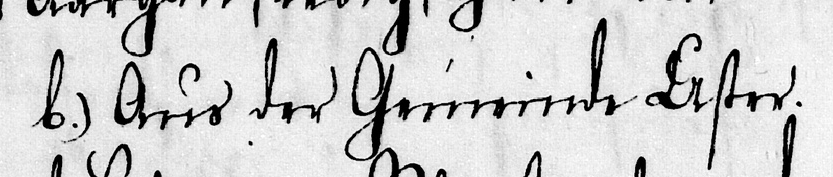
b.) Aus der Gemeinde Uster.
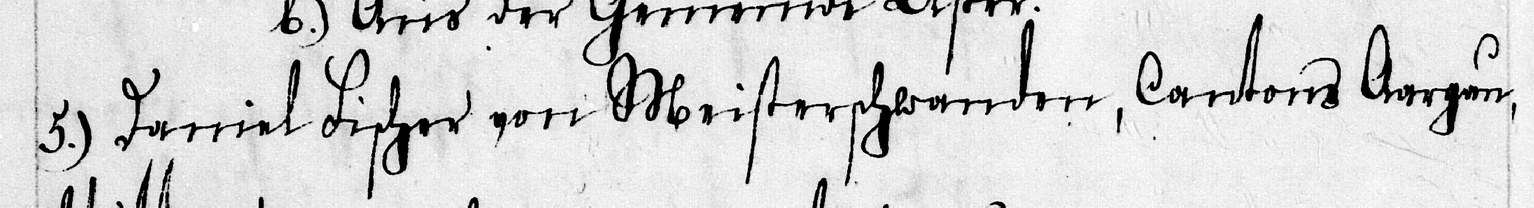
5.) Daniel Fischer von Meisterschwanden, Cantons Aargau,
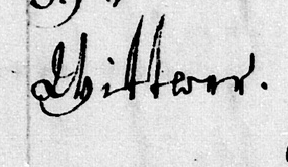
Wittwer.
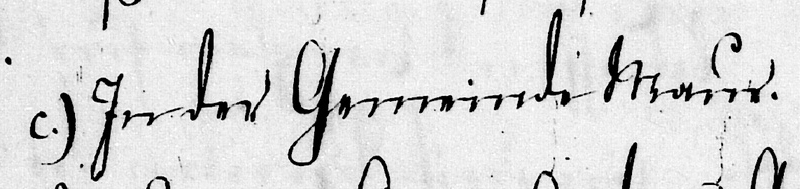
c.) In der Gemeinde Maur.
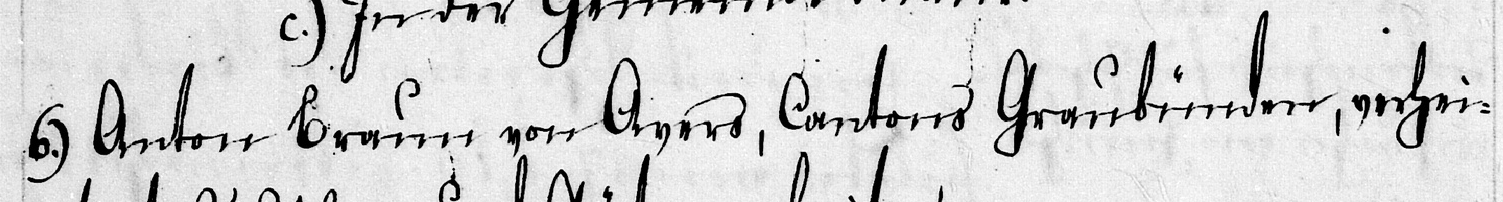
6.) Anton Braun von Avers, Cantons Graubünden, verhei¬
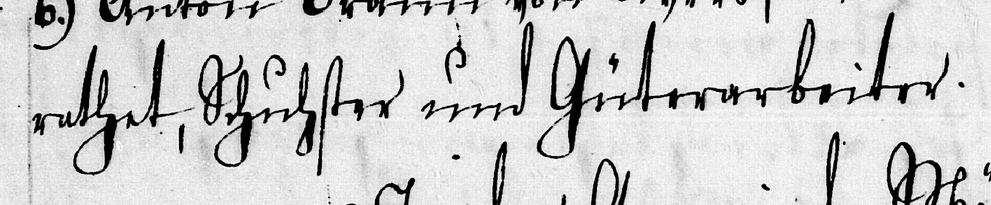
rathet, Schuhster und Güterarbeiter.
